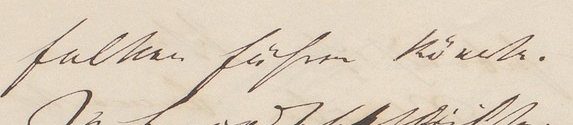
Falken führen könnte.
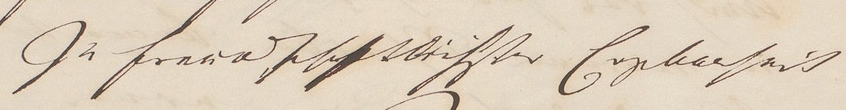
In freundschaftlichster Ergebenheit
